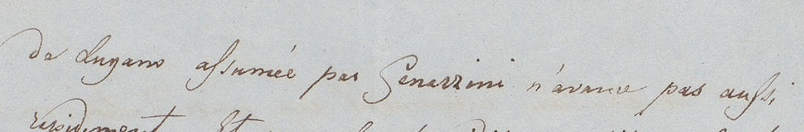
de Lugano assumée par Genazzini n'avance pas aussi
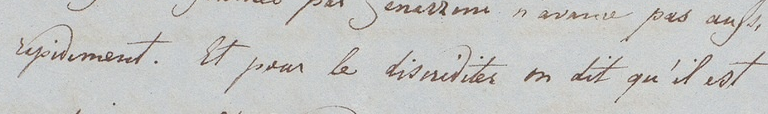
rapidement. Et pour le discréditer on dit qu'il est
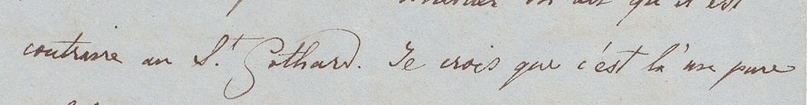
contraire au St Gothard. Je crois que c'est là une pure
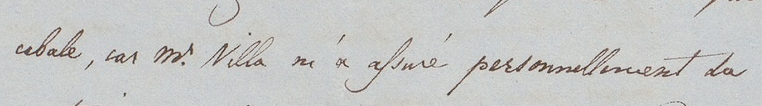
cabale, car MrVilla m'a assumé personnellement du
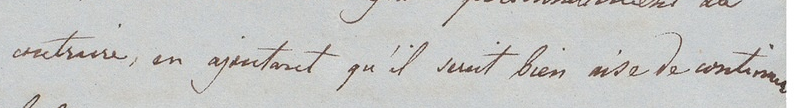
contraire, en ajoutant qu'il serait bien aise de continuer
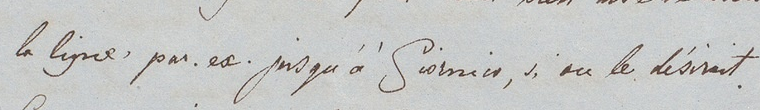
la ligne, par ex. jusqu'à Giornico, si on le désirait.
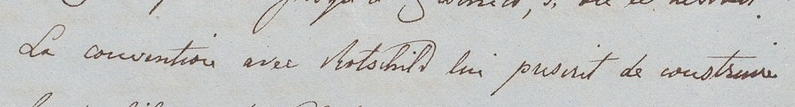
La convention avec Rotschild lui prescrit de construire
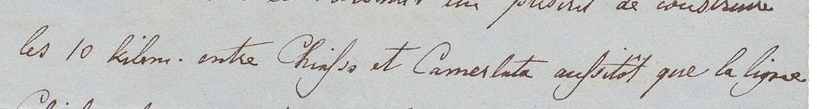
les 10 kilom. entre Chiasso et Camerlata aussitôt que la ligne
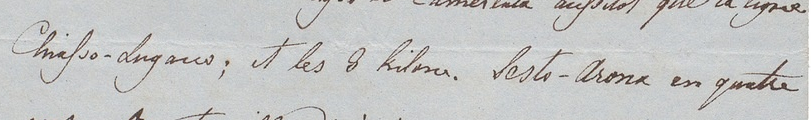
Chiasso–Lugano; et les 8 kilom. Sesto–Arona en quatre
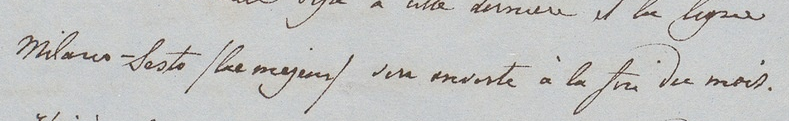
Milano–Sesto (le moyen) son ouvorte à la fin du mois.
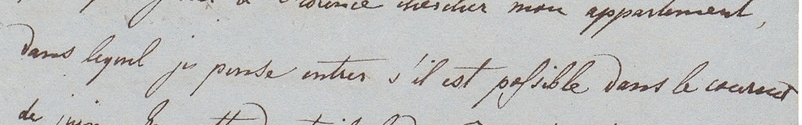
dans lequel je pense entrer s'il est possible dans le courant
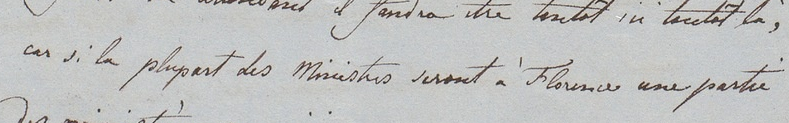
car si la plupart des Ministres seront à Florence une partie
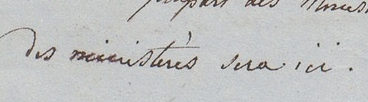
des ministères sera ici.
